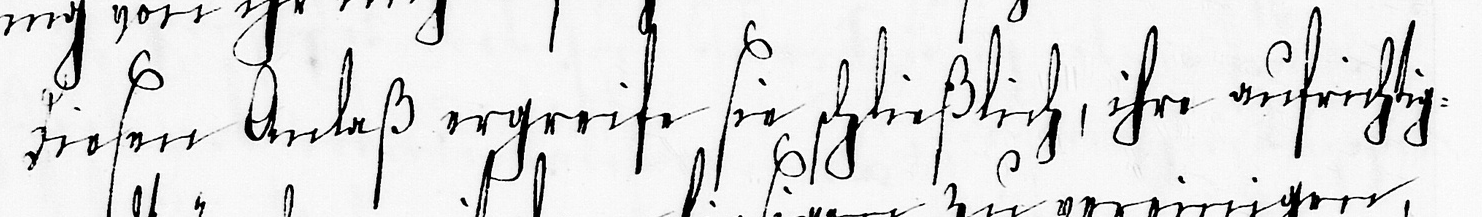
Diesen Anlaß ergreife sie schließlich, ihre aufrichti¬
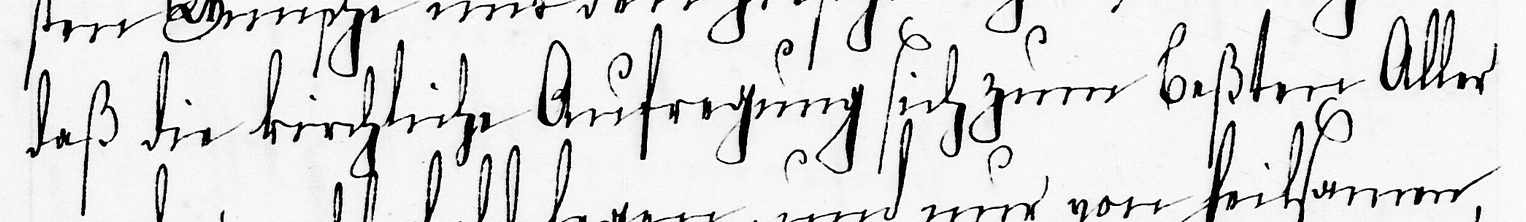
daß die kirchliche Aufregung sich zum beßten Aller
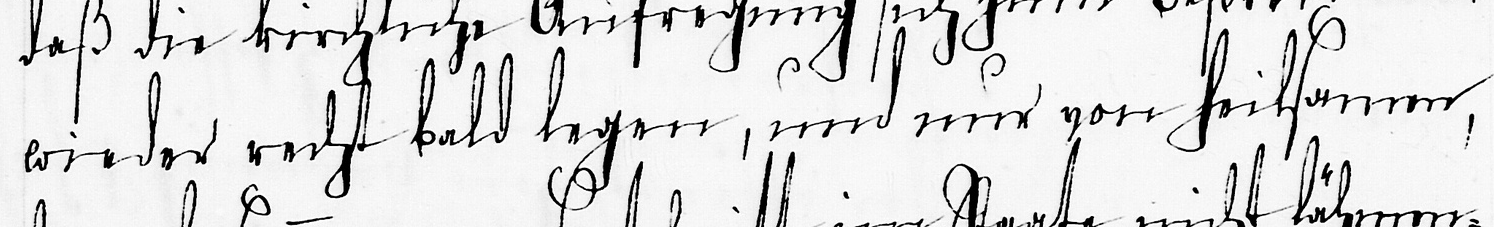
wieder recht bald legen, und nur von heilsamen,
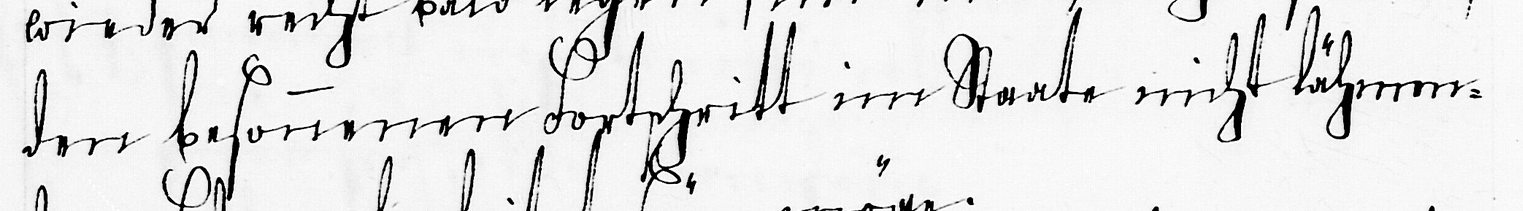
den besonnenen Fortschritt im Staate nicht lähmen¬
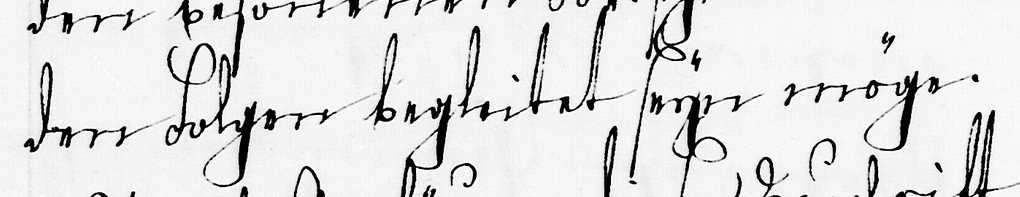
den Folgen begleitet seyn möge.
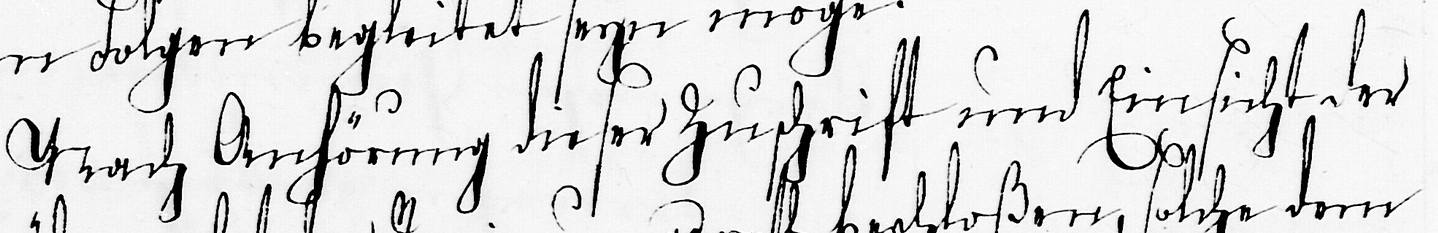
Nach Anhörung dieser Zuschrift und Einsicht der
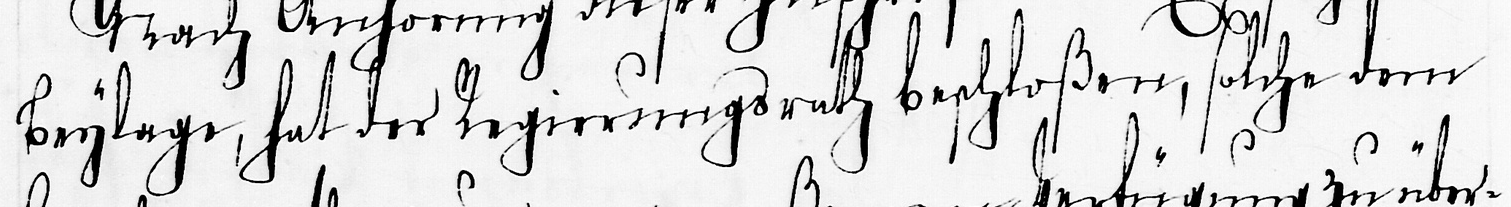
Beylage, hat der Regierungsrath beschloßen, solche dem
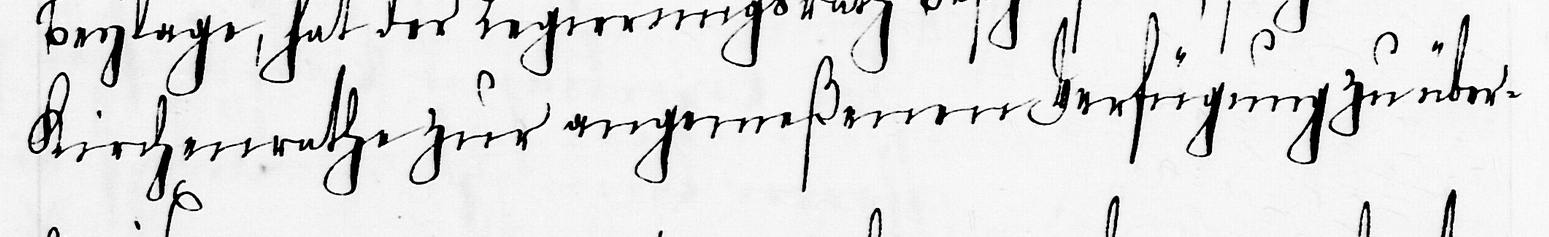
Kirchenrathe zur angemeßenen Verfügung zu über¬
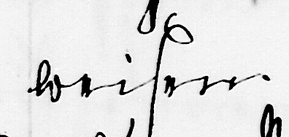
weisen.
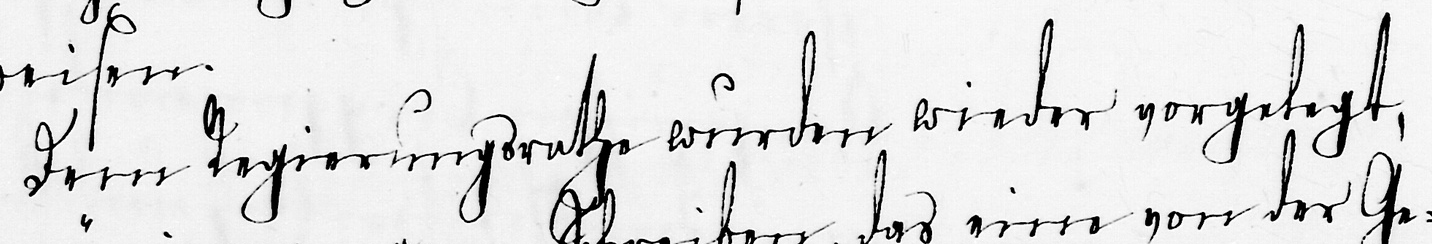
Dem Regierungsrathe wurden wieder vorgelegt,
